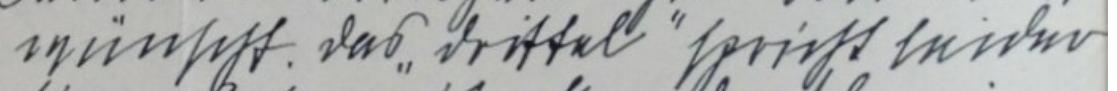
wünscht. Das „Drittel" spricht leider
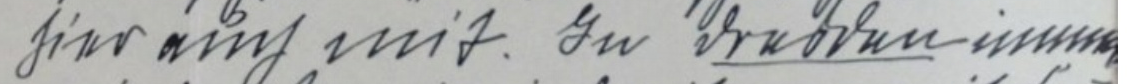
hier auch mit. In Desden immer
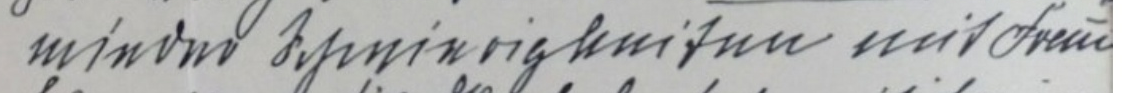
wieder Schwiereigkeiten mit Frau
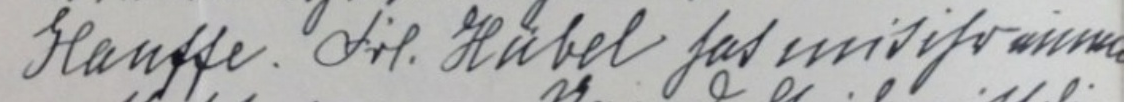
Hauffe. Frl. Hübel hat mit ihr einen
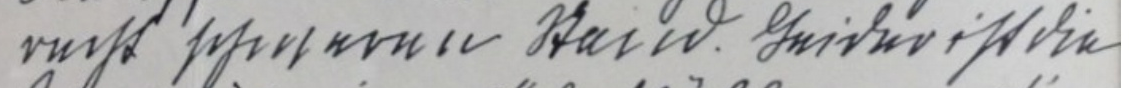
recht schweren Stand. Leider ist die
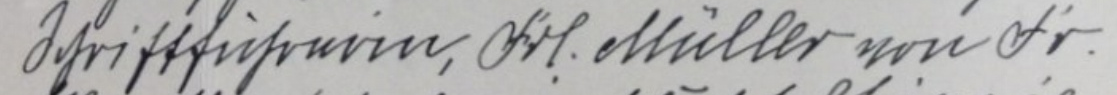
Schriftführering Frl. Müller von Fr.
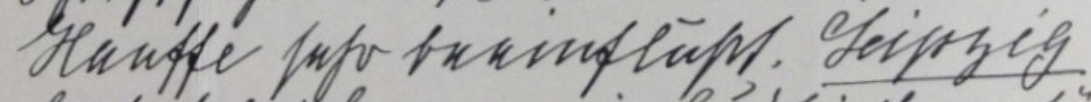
Hauffe sehr beeinflußt. Leipzig
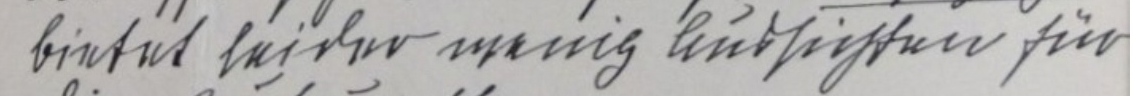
bietet leider wenig Aussichten für
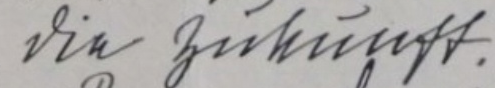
die Zukunft.
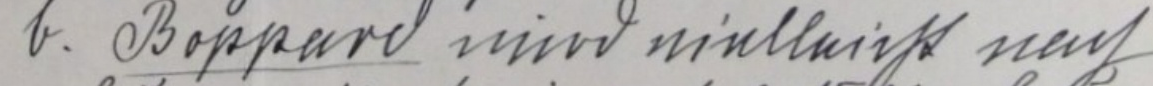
b. Boppard wird vielleicht nach
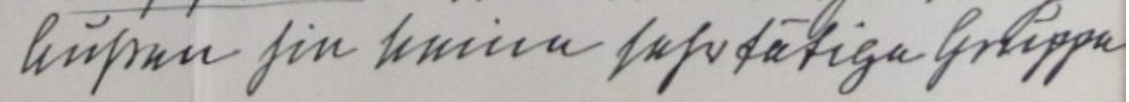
Au0en hin keine sehr tätige Gruppe
